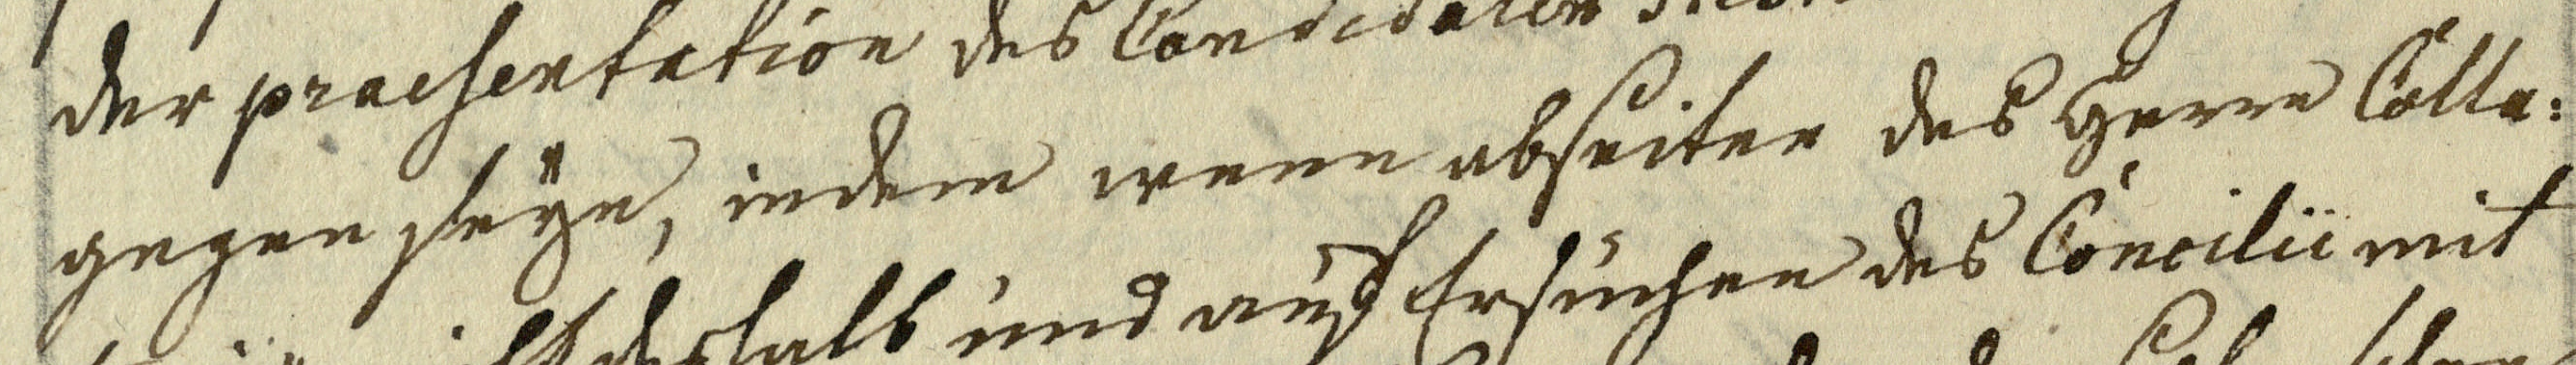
gegen seÿn, indem wenn abseiten des Herrn Colla¬
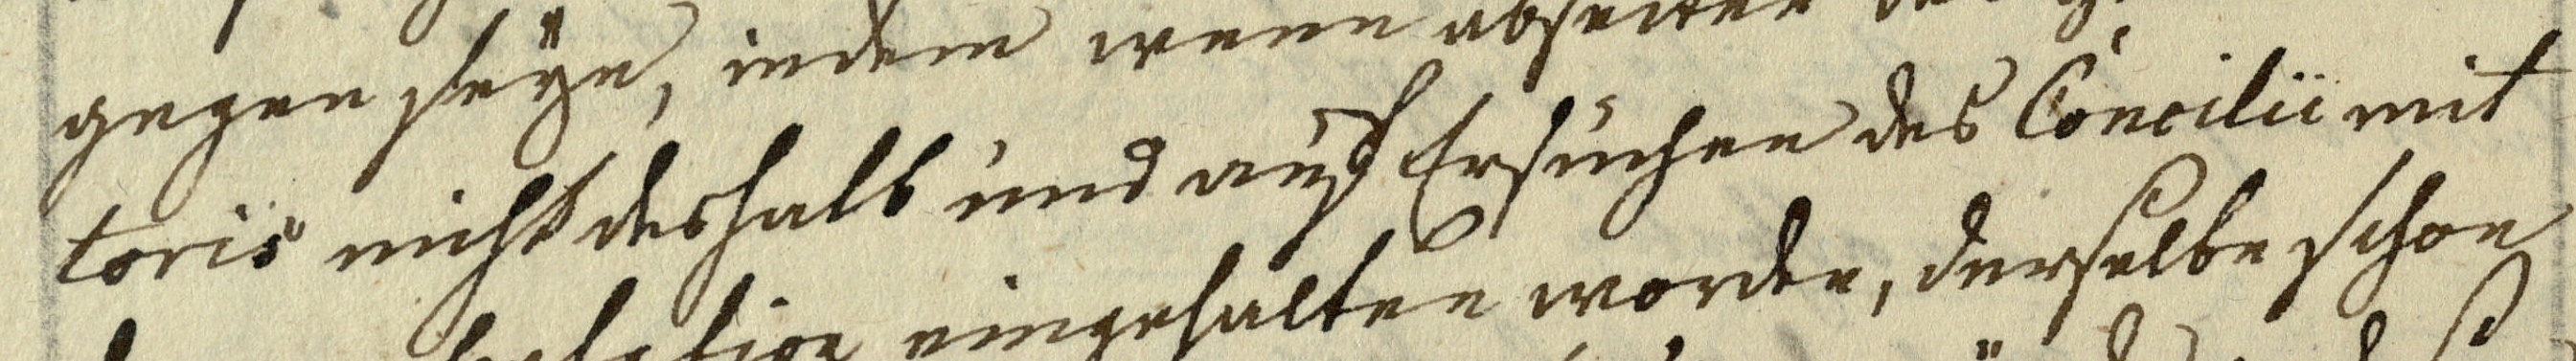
toris nicht deshalb und auf Ersuchen des Concilii mit
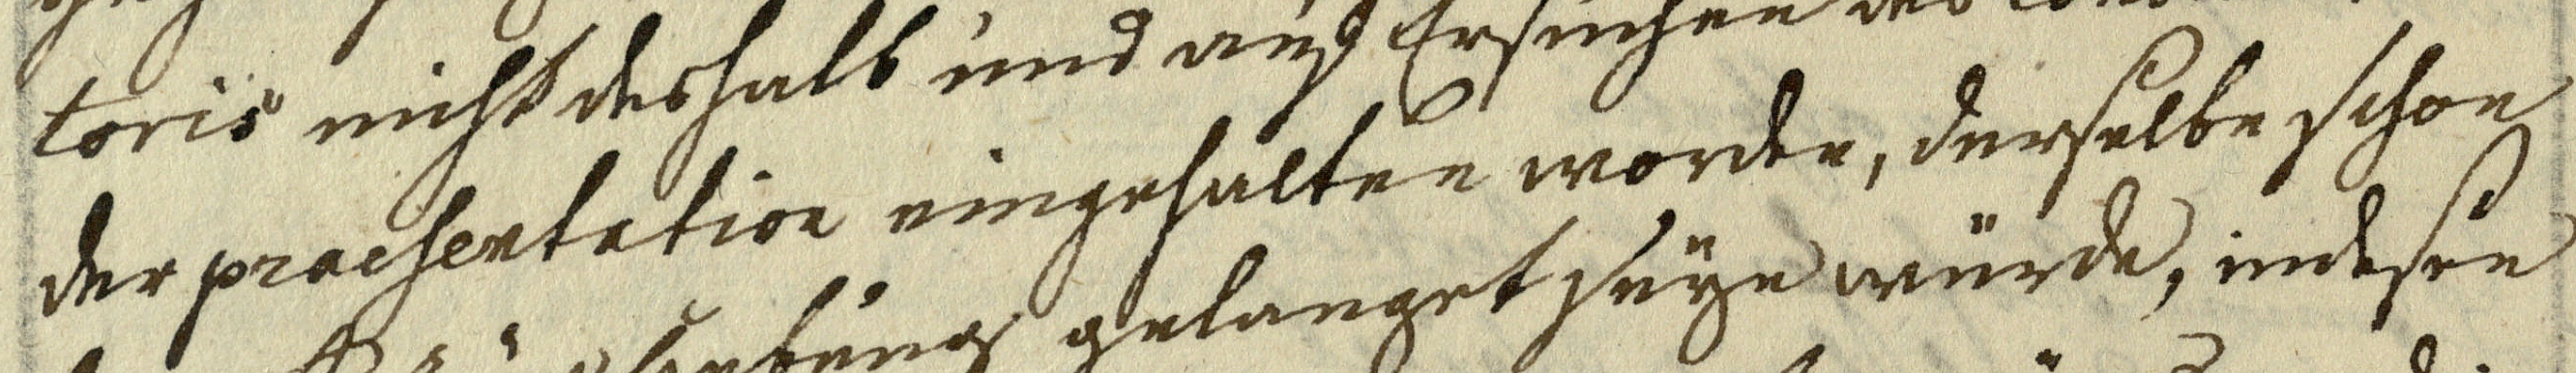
der praesentation eingehalten worden, derselbe schon
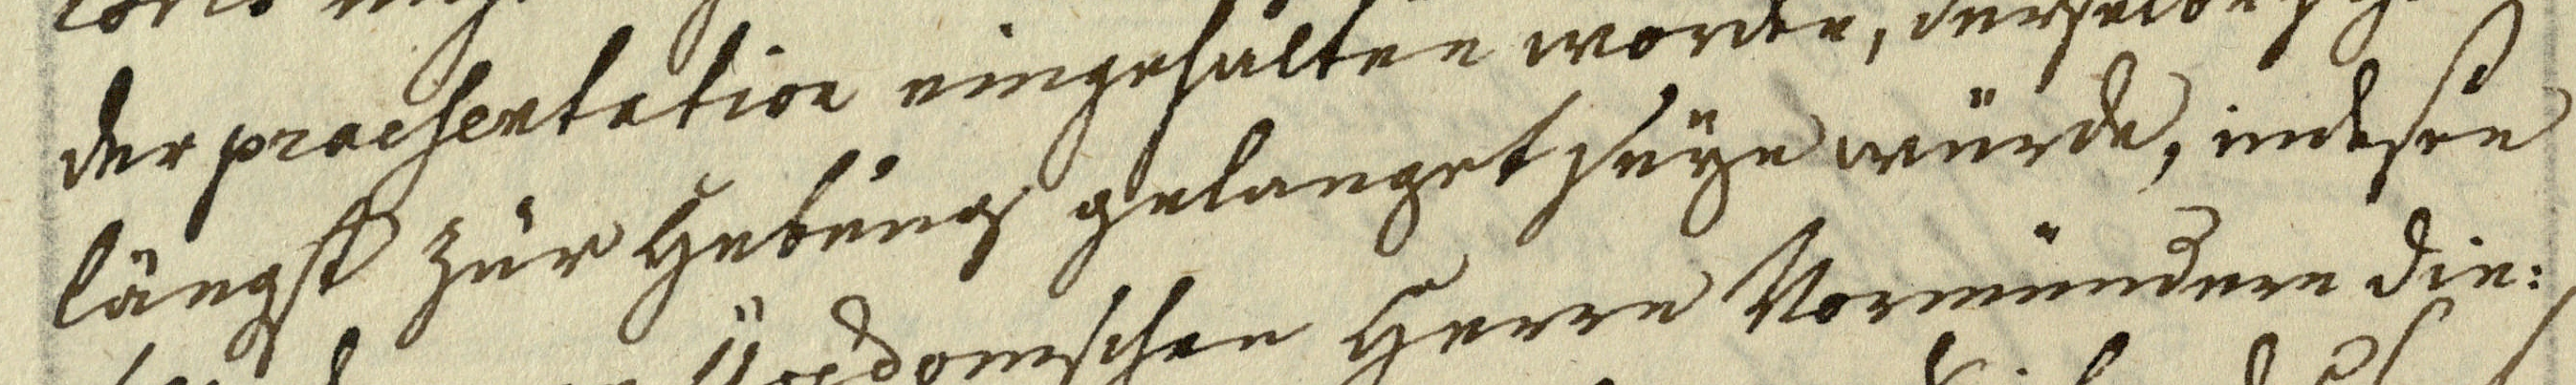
längst zur Hebung gelanget seÿn würde, indeßen
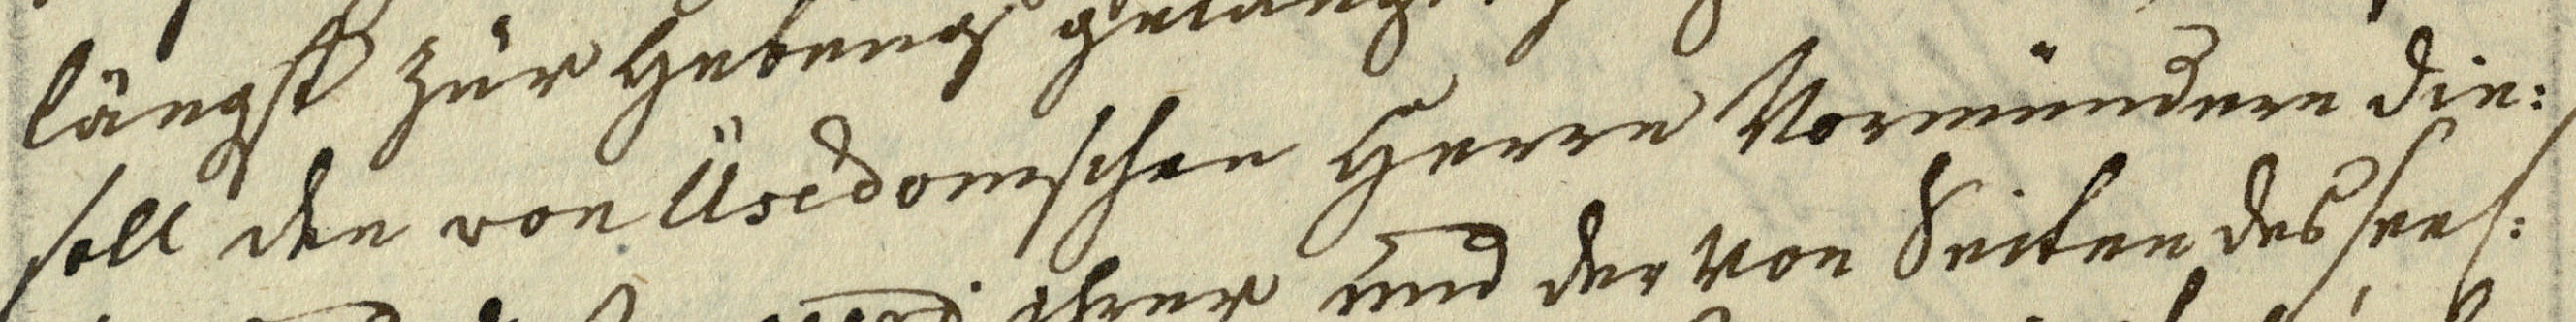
soll den von Üsedomschen Herrn Vormündern die¬
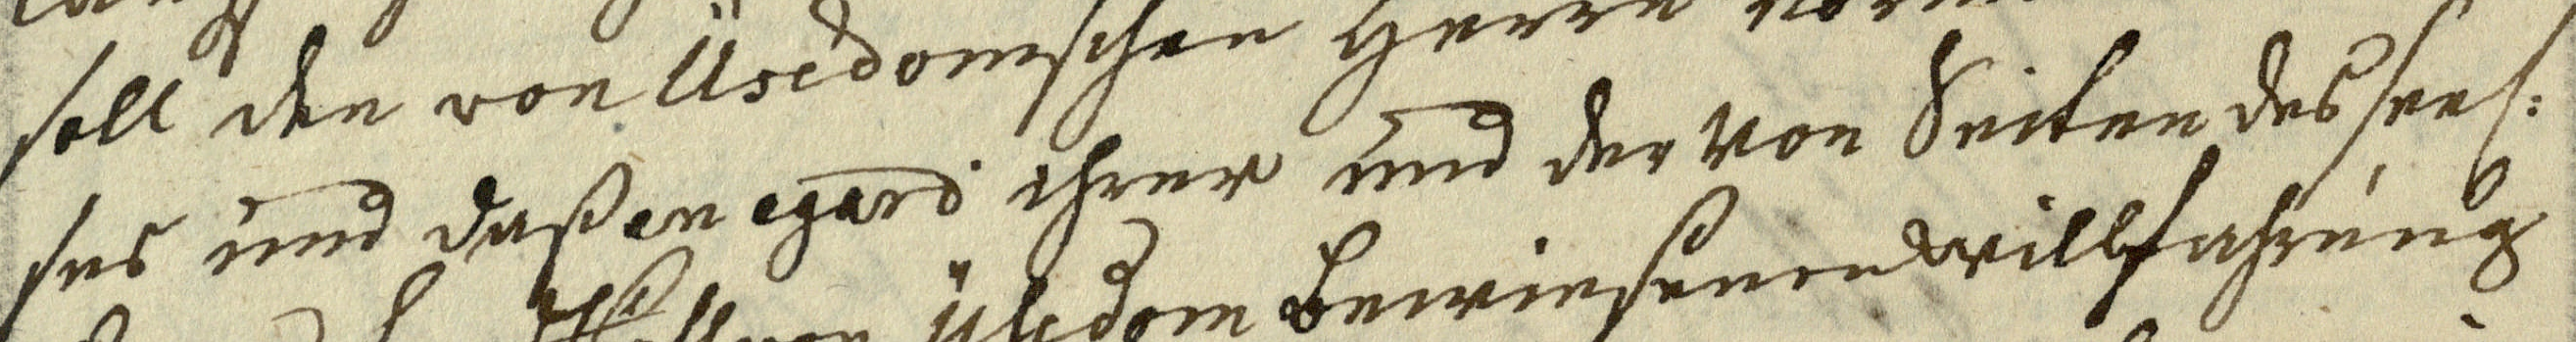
ses und daß en egard ihrer und der von Seiten des seel.
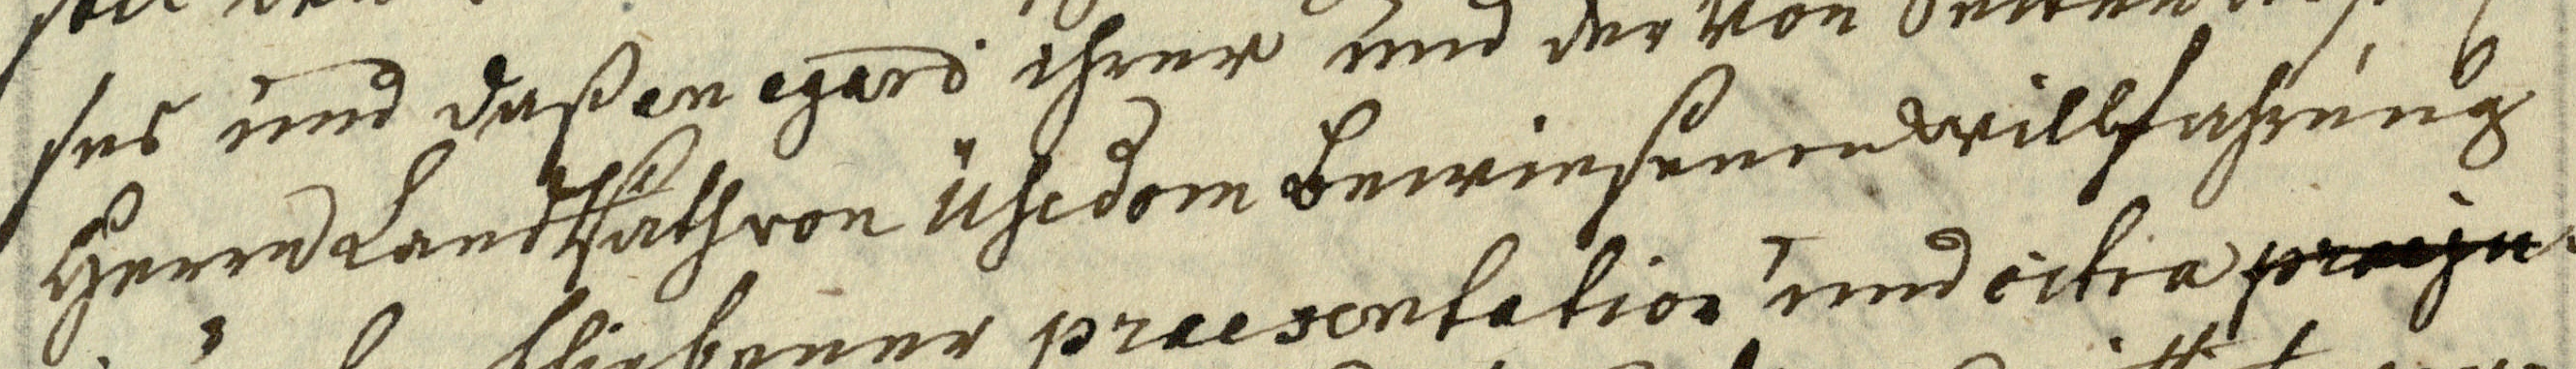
Herrn LandRath von Üsedom bewiesenen Willfahrung
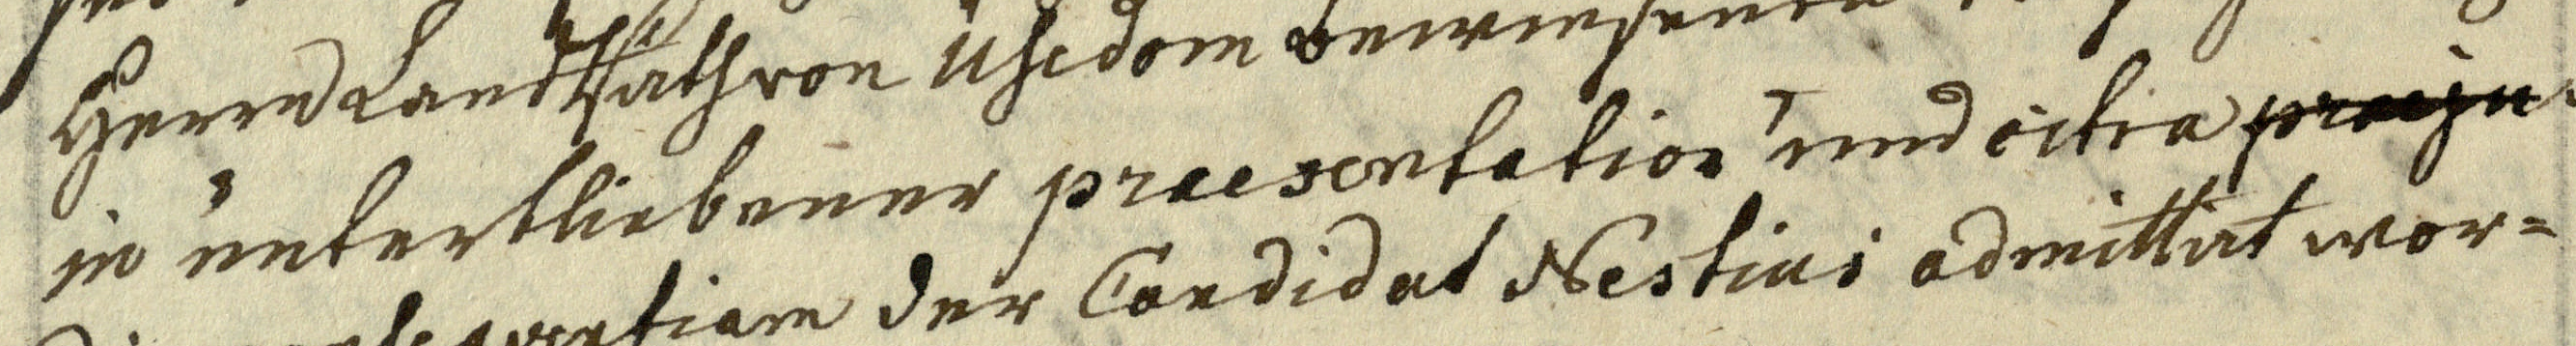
in unterbliebener praesentation und ectra praeju
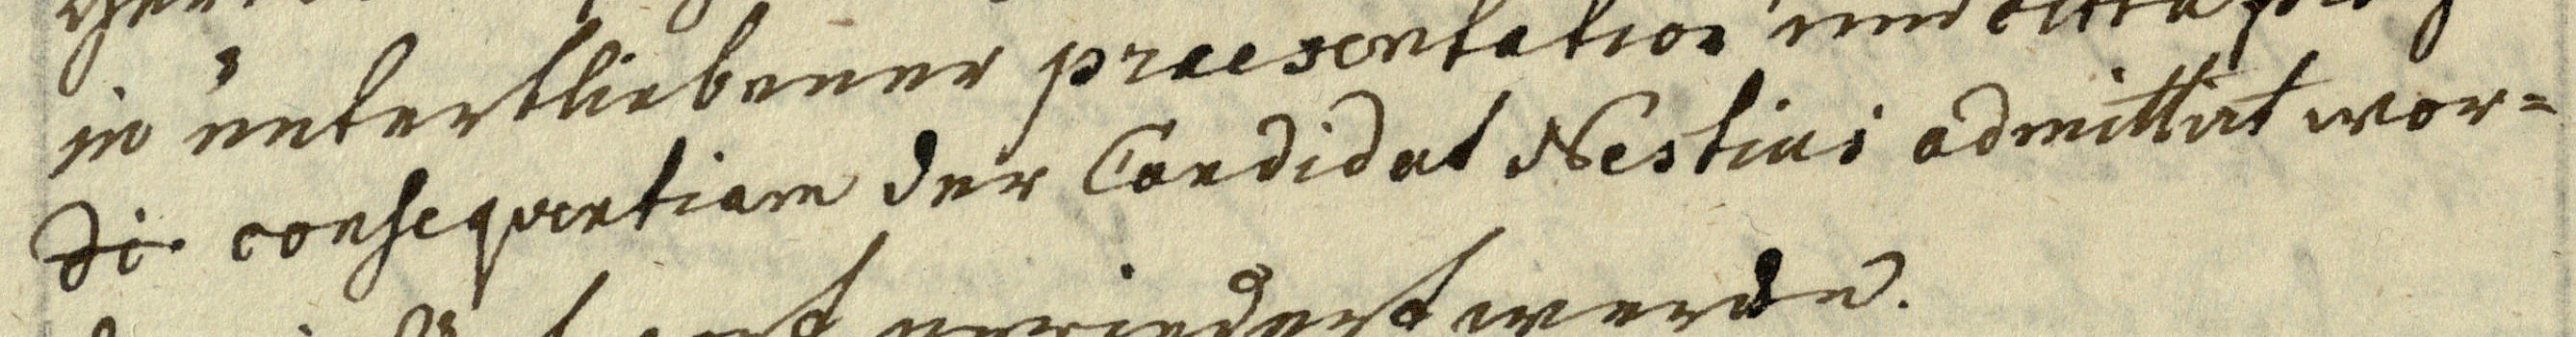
di. consequentiam der Candidat Nestius admittirt wor¬
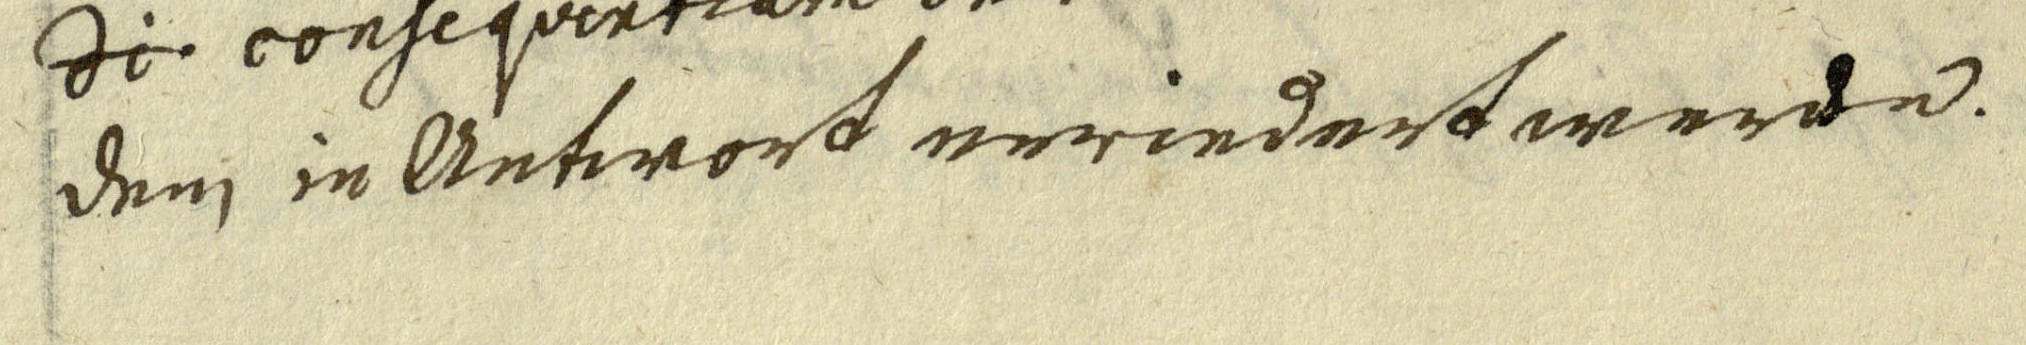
den, in Antwort erwiedert werden.
